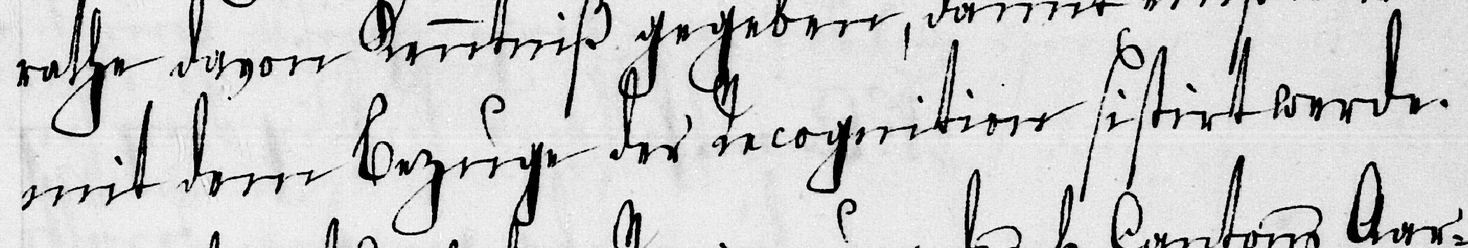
mit dem Bezuge der Recognition sistirt werde.
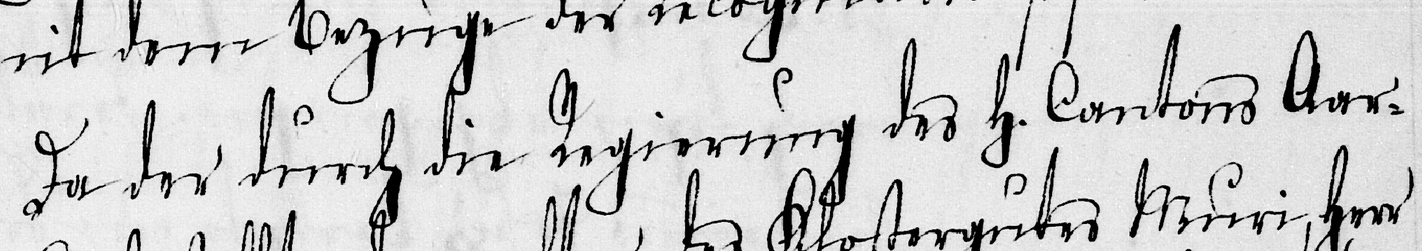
Da der durch die Regierung des H. Cantons Aar¬
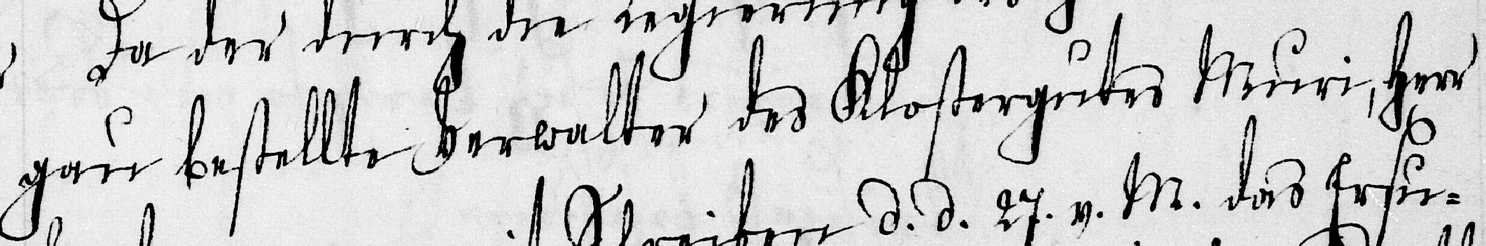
gau bestellte Verwalter des Klostergutes Muri, Herr
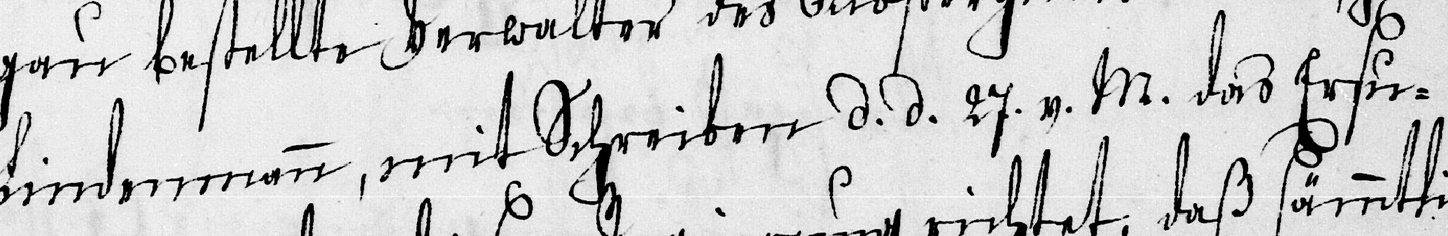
Lindenmann, mit Schreiben d. d. 27. v. M. das Ersu¬
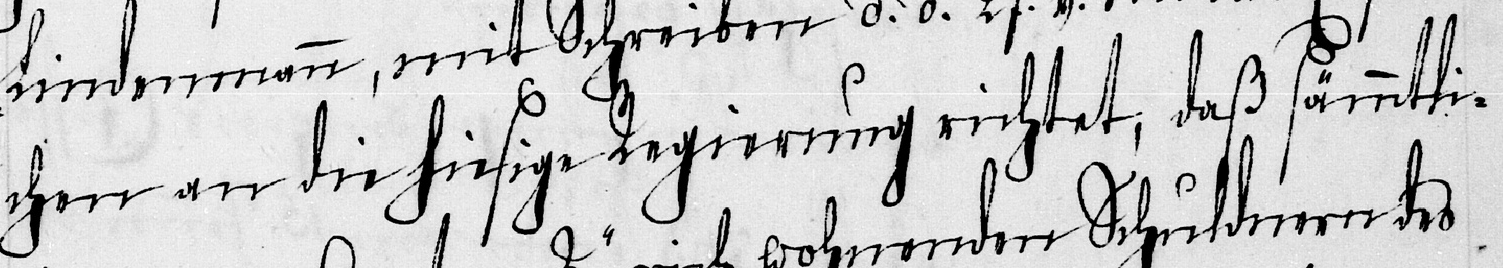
chen an die hiesige Regierung richtet, daß sämmtli¬
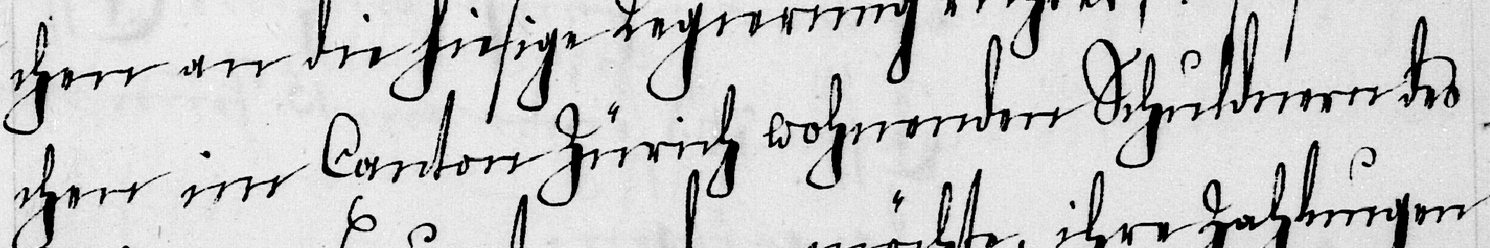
chen im Canton Zürich wohnenden Schuldnern des
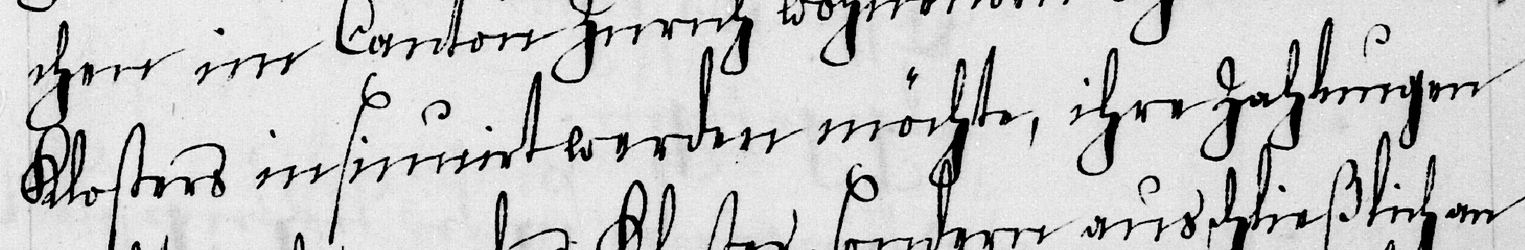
Klosters insinuirt werden möchte, ihre Zahlungen
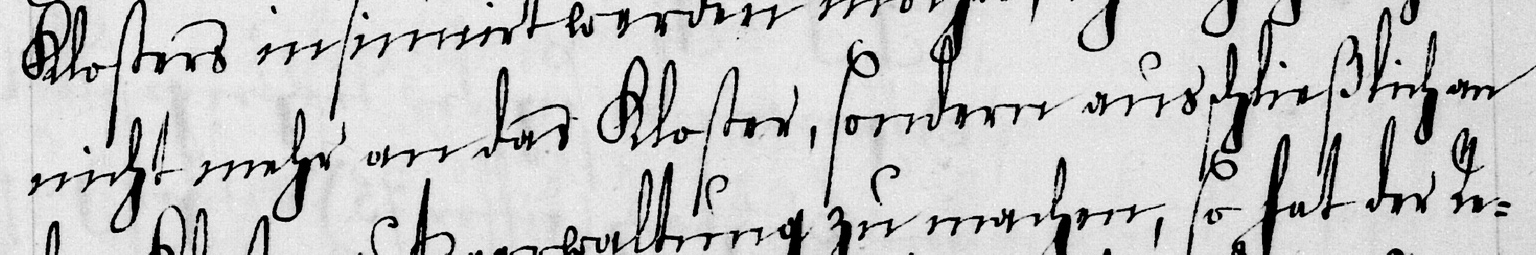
nicht mehr an das Kloster, sondern ausschließlich an
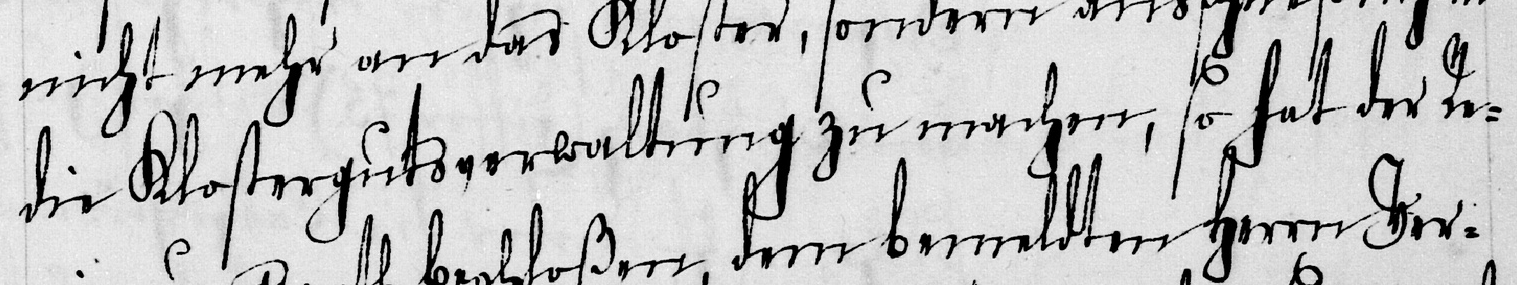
die Klostergutsverwaltung zu machen, so hat der Re¬
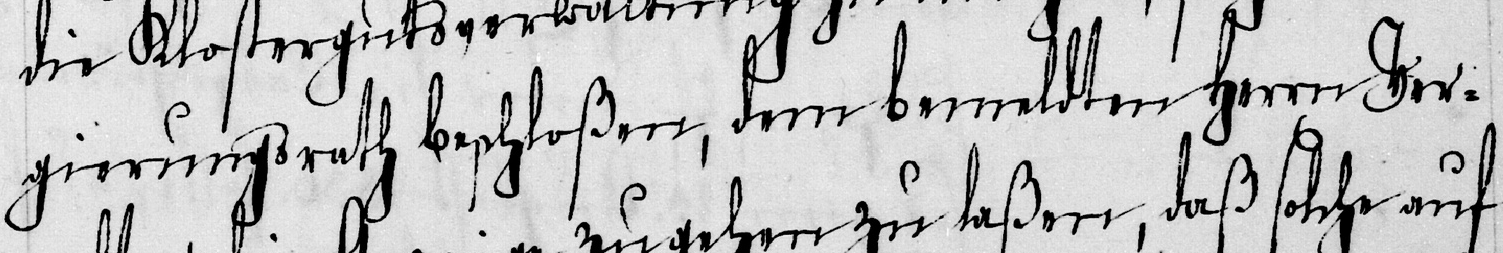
gierungsrath beschloßen, dem bemeldten Herrn Ver¬
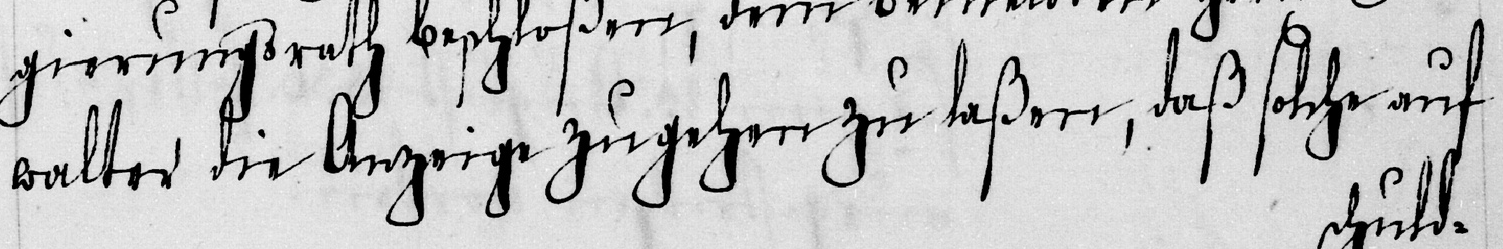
walter die Anzeige zugehen zu laßen, daß solche auf
